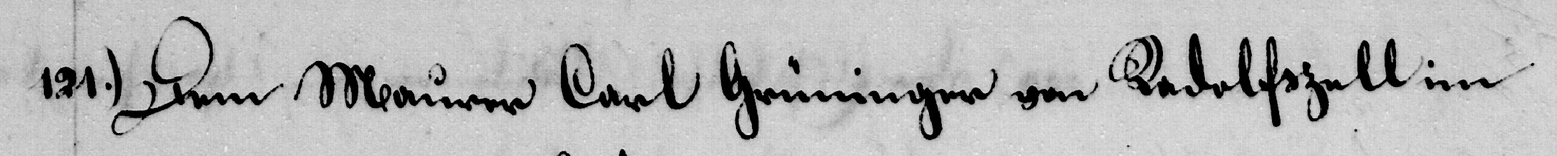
121.) “ Maurer Carl Grüninger von Radolfszell im
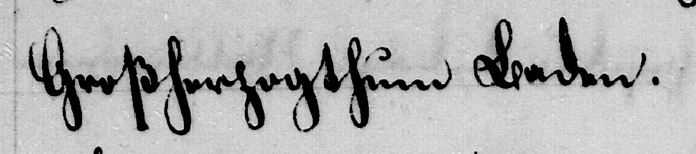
Großherzogthum Baden.
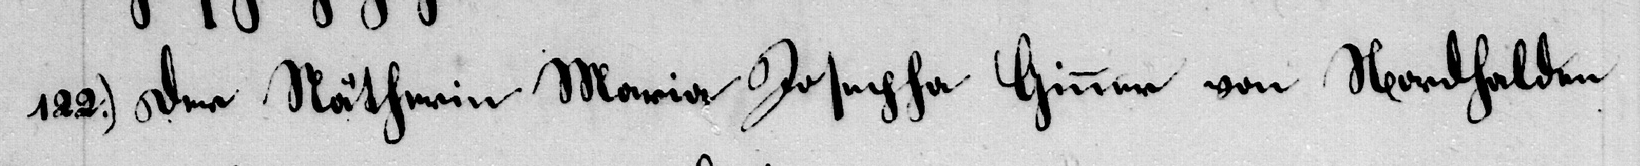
122.) Der Nätherin Maria Josepha Ginner von Nordhalden
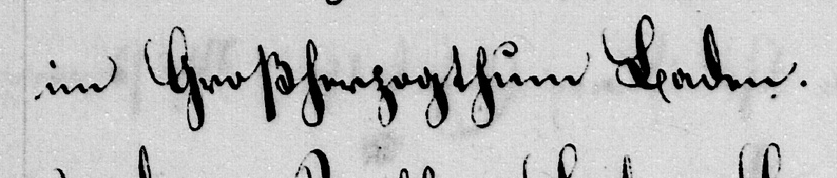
im Großherzogthum Baden.
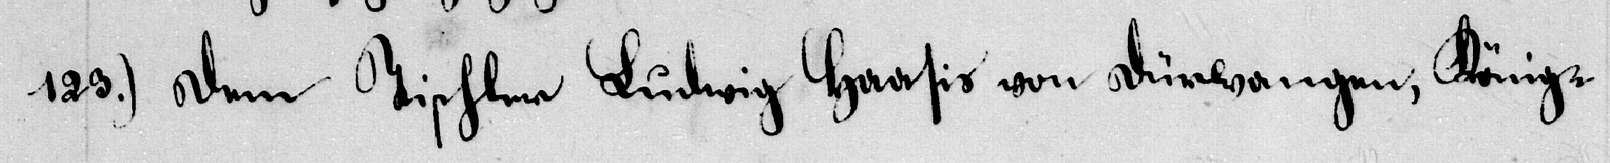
123.) Dem Tischler Ludwig Haasis von Dürwangen, König¬
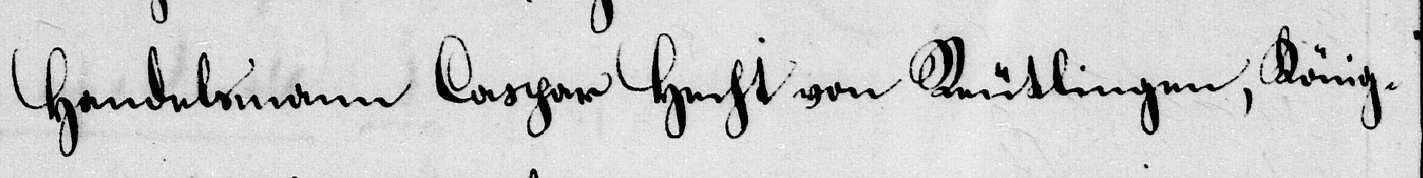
Handelsmann Caspar Hecht von Reutlingen, König¬
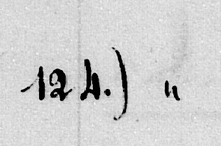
124.) “
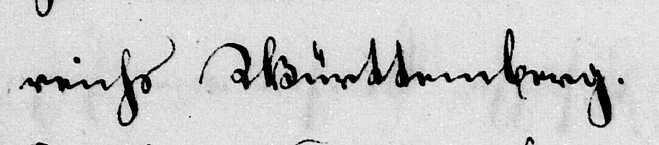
reichs Württemberg.
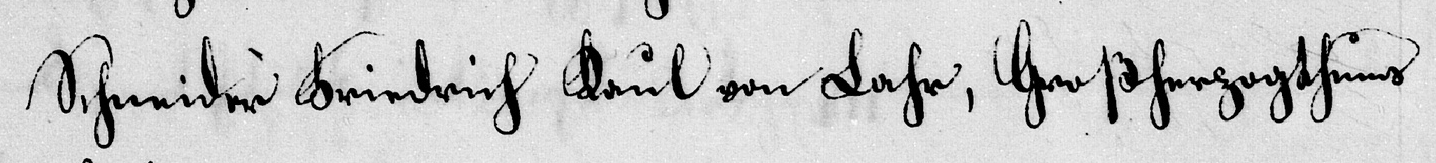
Schneider Friedrich Kaul von Fahr, Großherzogthums
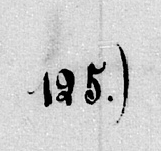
125.)
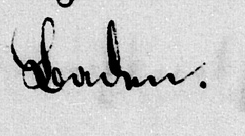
Baden.
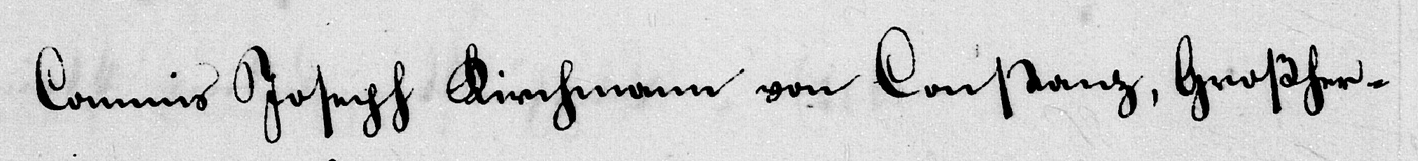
Commis Joseph Kirchmann von Constanz, Großher¬
